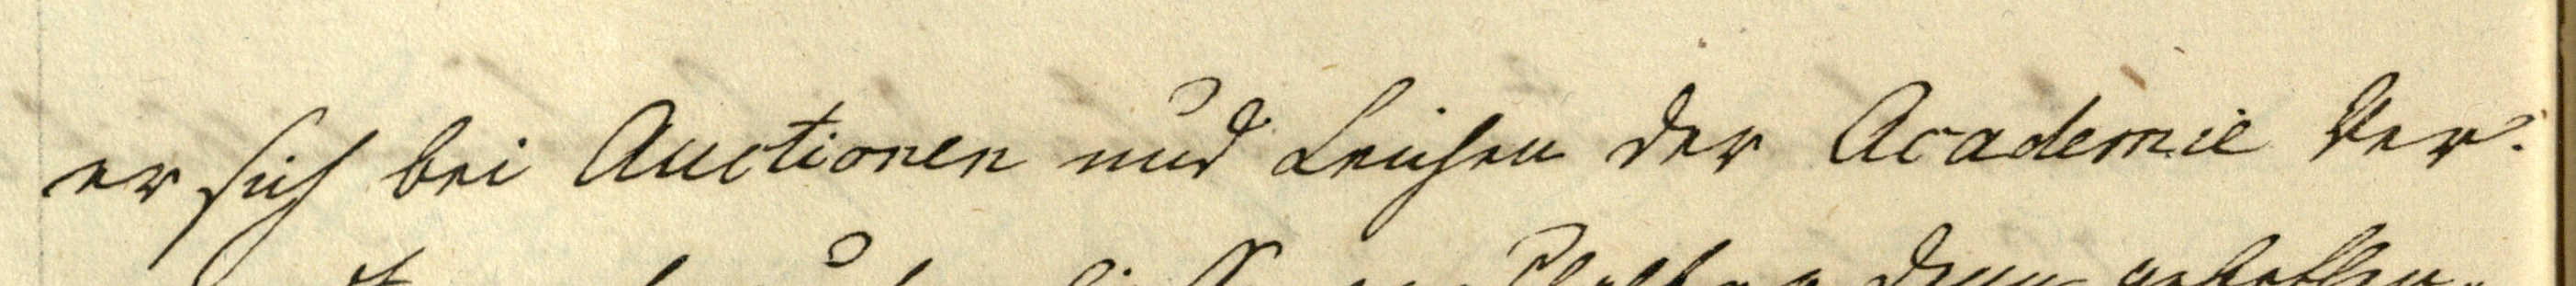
er sich bei Auctionen und Leichen der Academie Ver¬
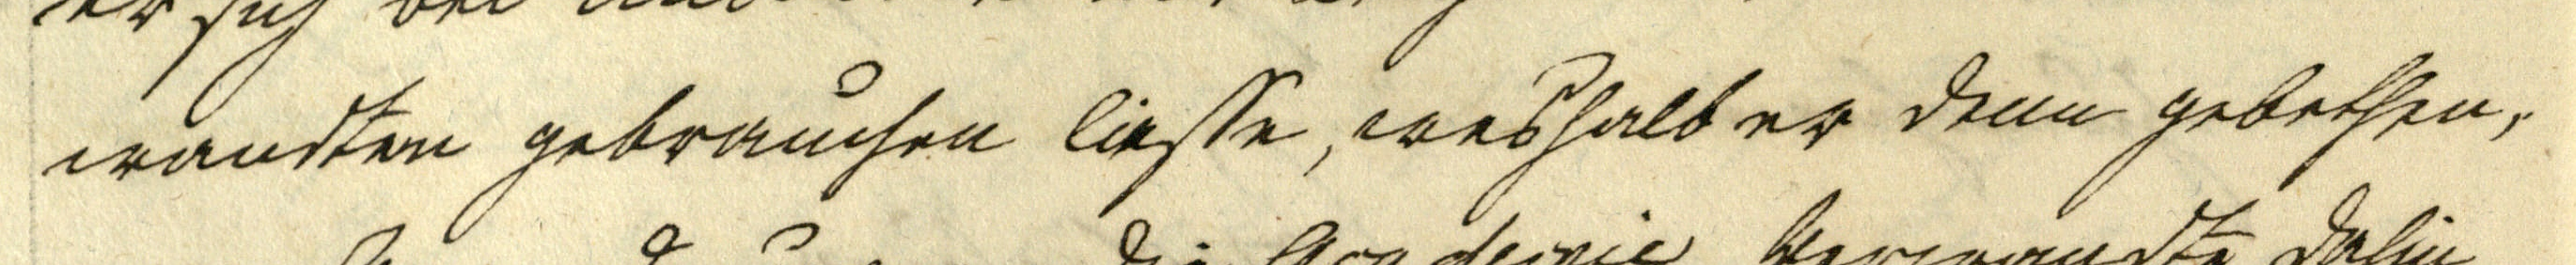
wandten gebrauchen lasse, weshalb er denn gebethen,
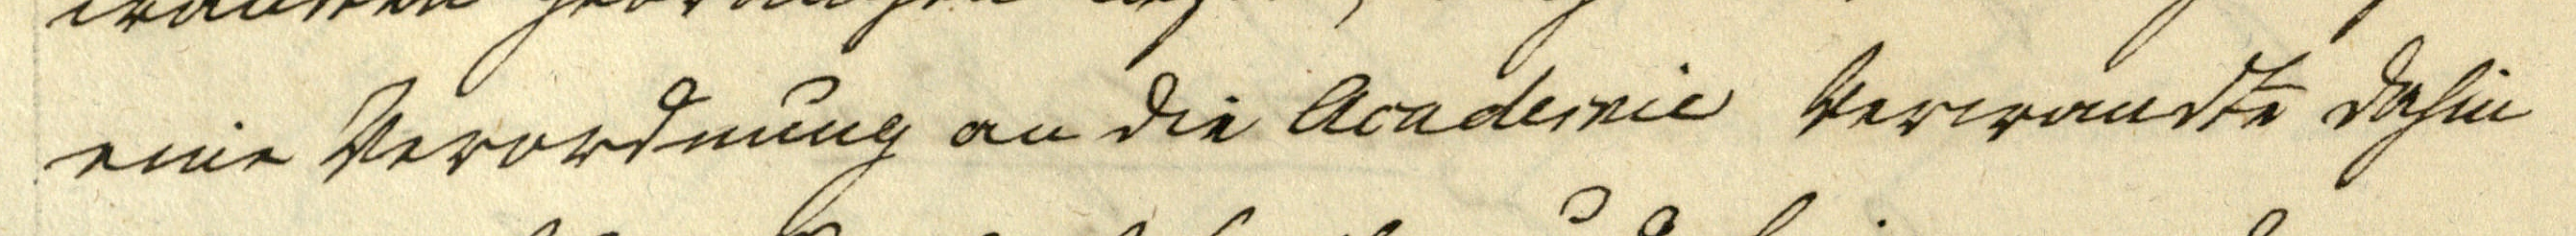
eine Verordnung an die Academie Verwandte dahin
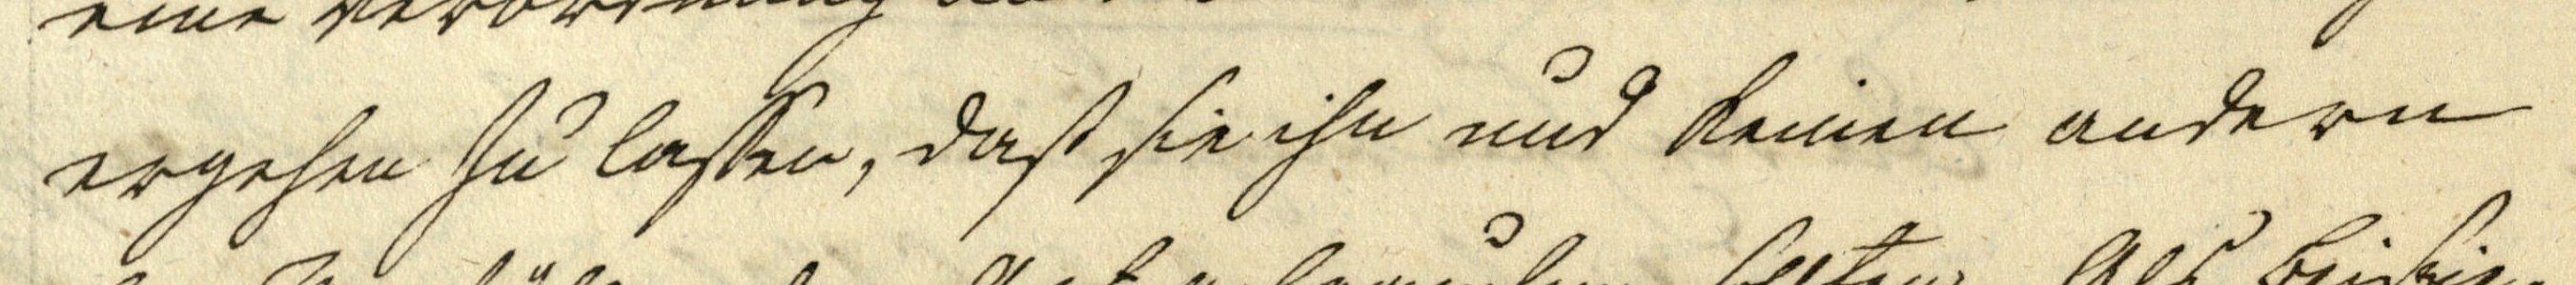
ergehen zu lassen, daß sie ihn und keinen andern
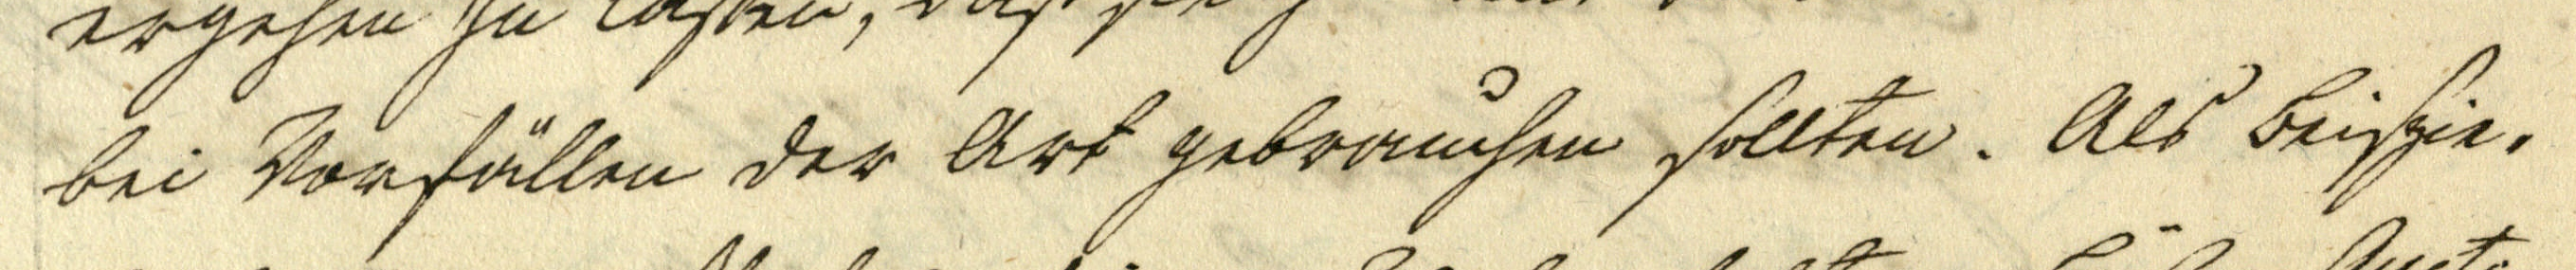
bei Vorfällen der Art gebrauchen sollten. Als Beispie¬
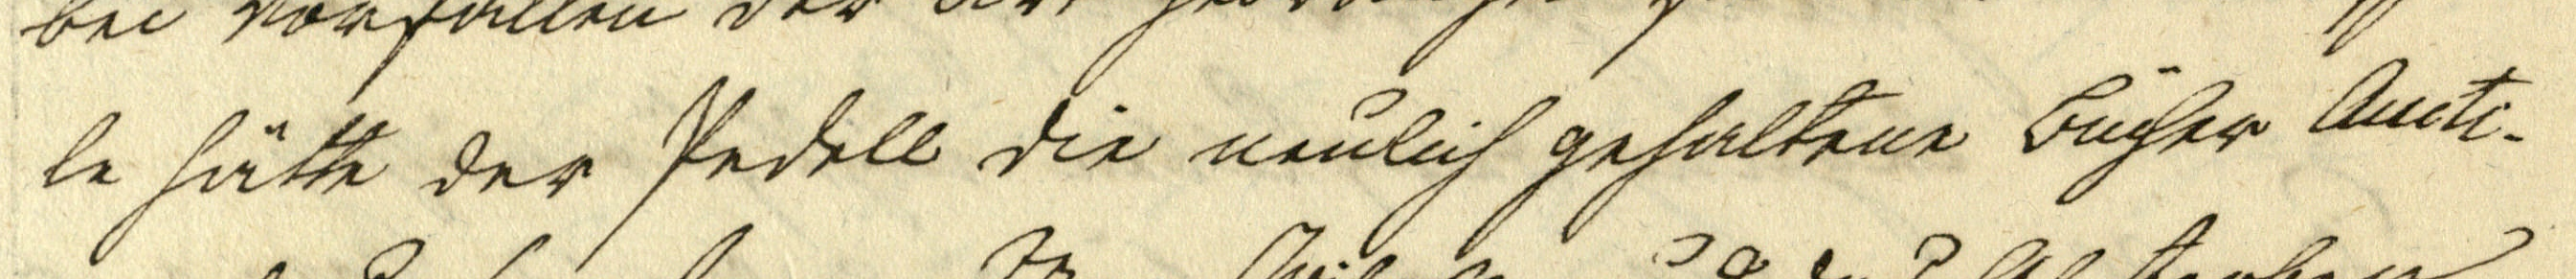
le hätte der Pedell die neulich gehaltene Bücher Aucti¬
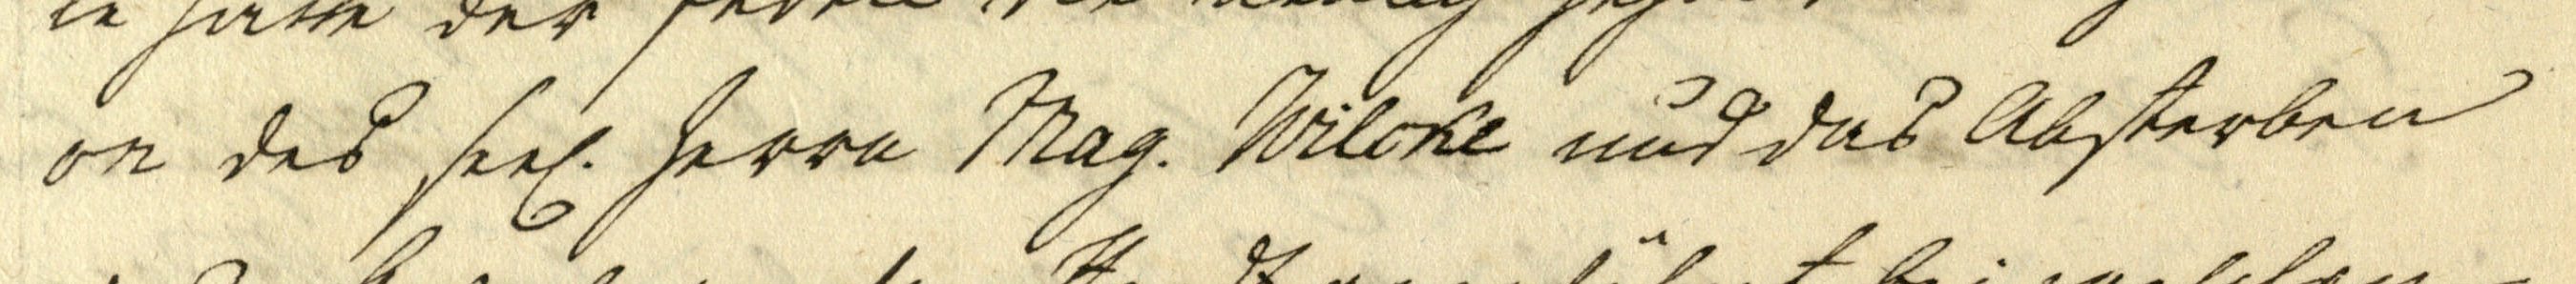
von des seel. Herrn Mag. Wilcke und das Absterben
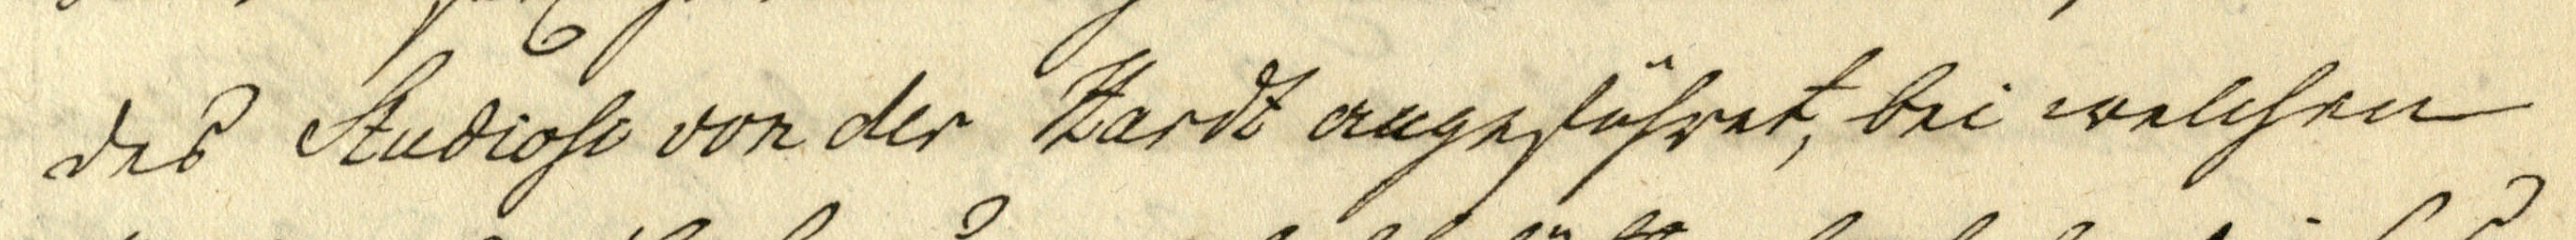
des Studiosi von der Hardt angeführet, bei welchen
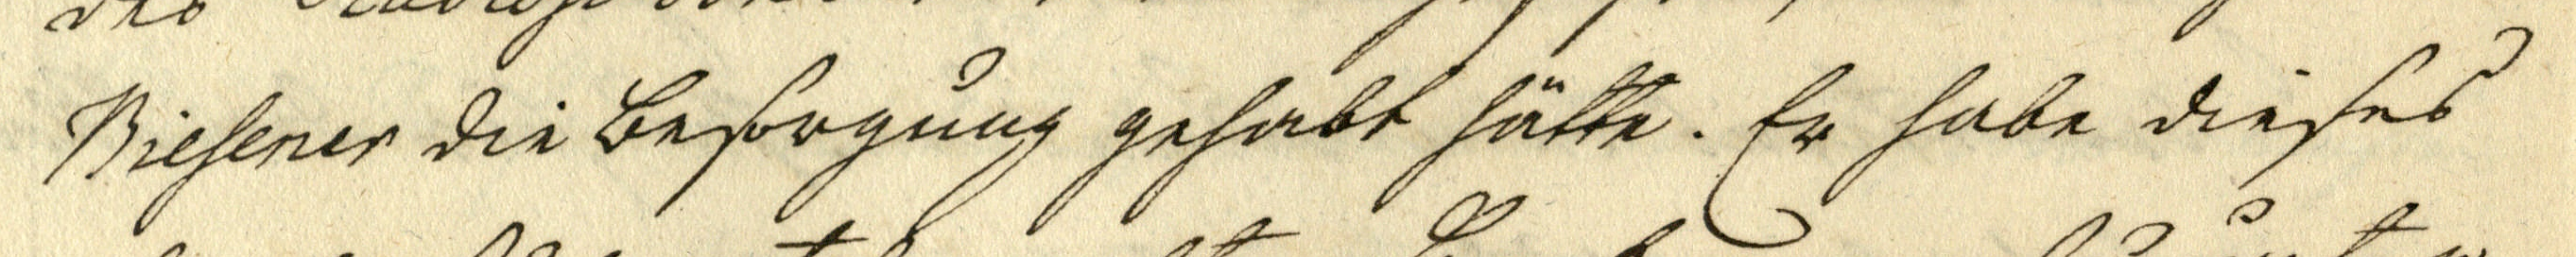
Biesener die Besorgung gehabt hätte. Er habe dieses
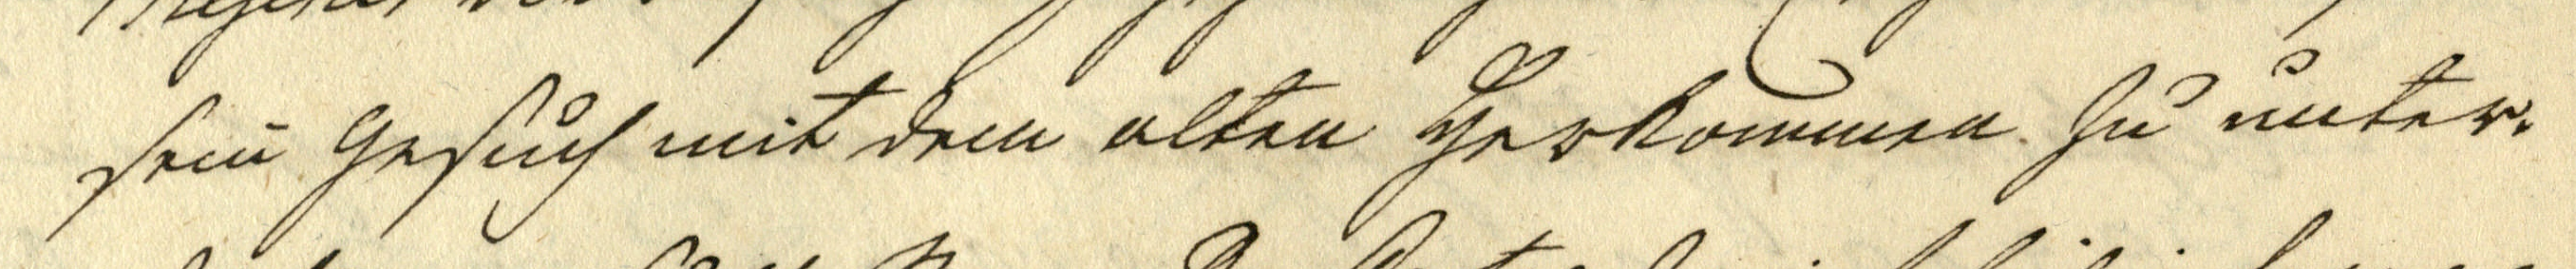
sein Gesuch mit dem alten Herkommen zu unter¬
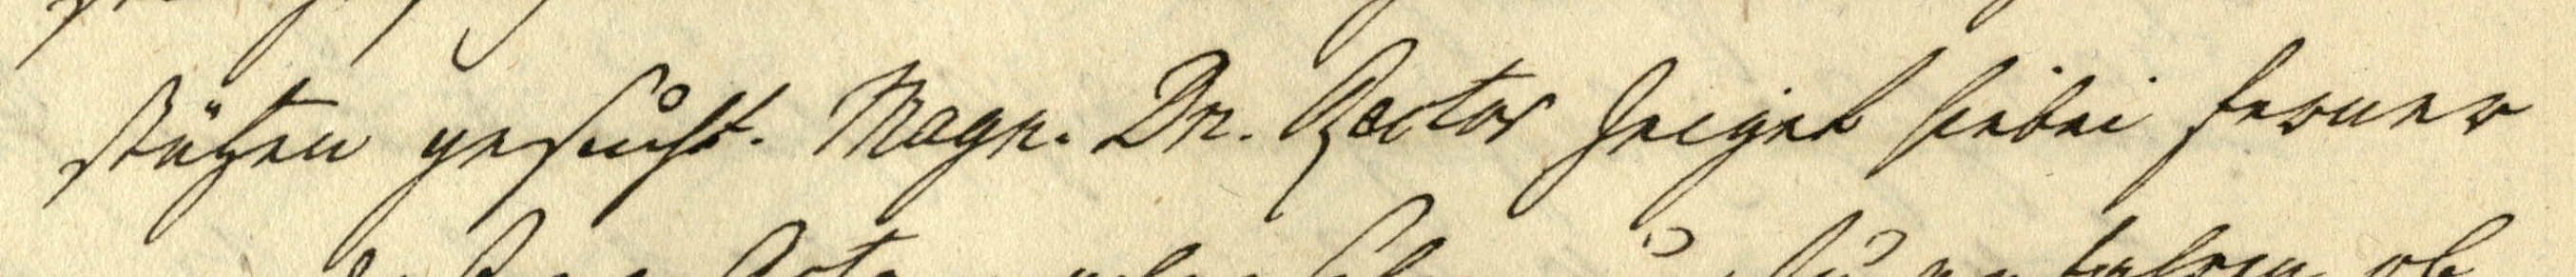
stützen gesucht. Magn. Dn. Rector zeiget hiebei ferner
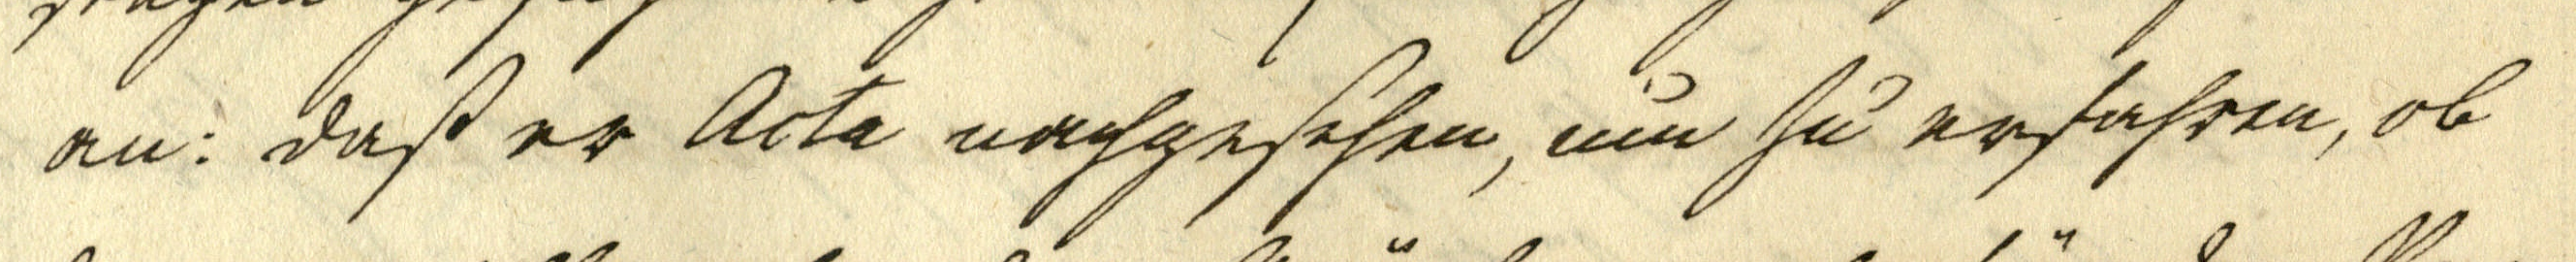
an: daß er Acta nachgeseten, um zu erfahren, ob
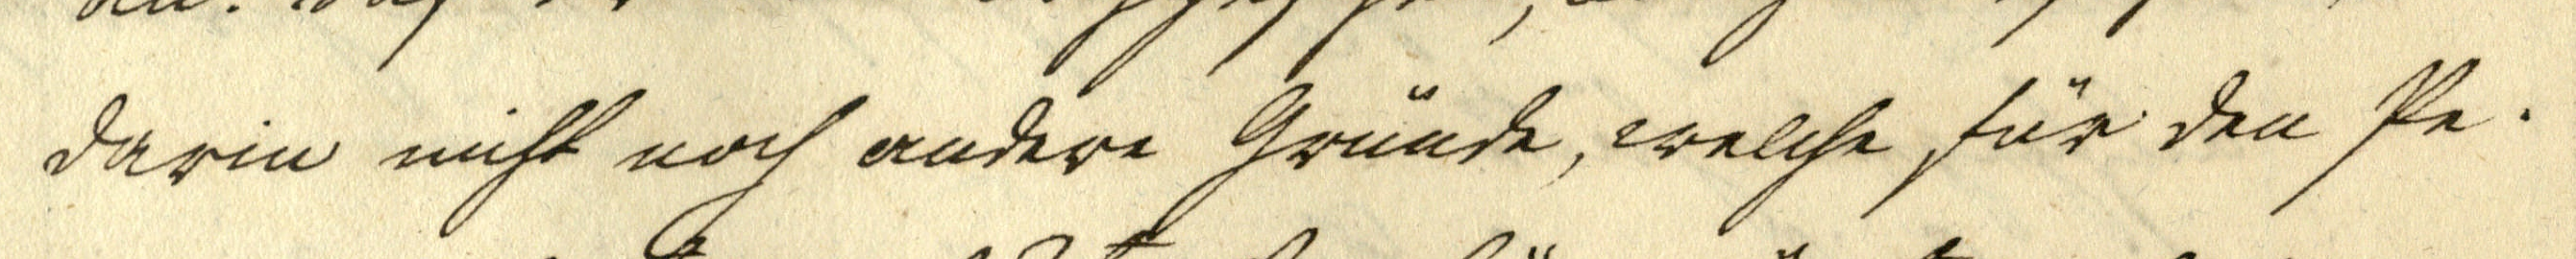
darin nicht noch andere Gründe, welche für den Pe¬
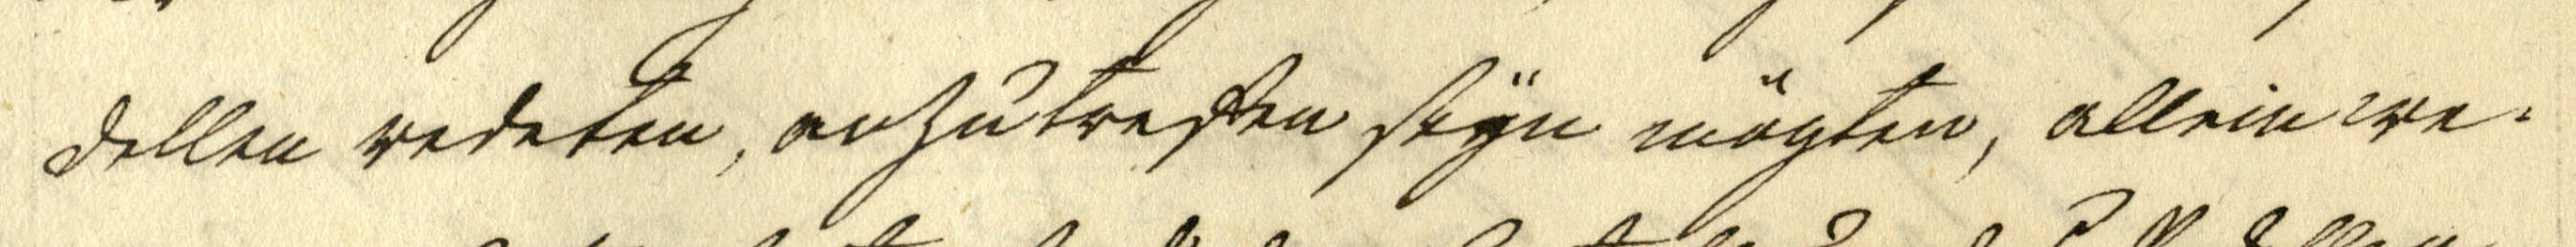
dellen redeten, anzutreten seÿn mögten, allein we¬
